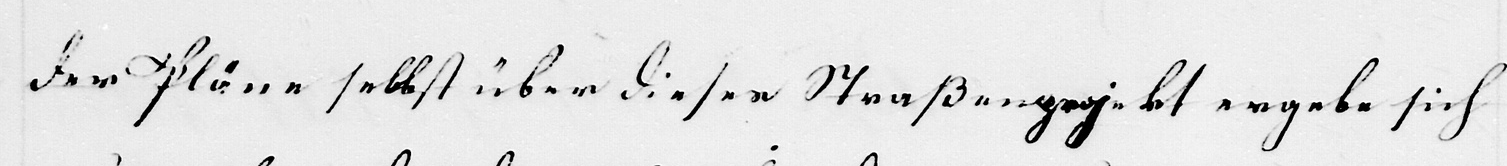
der Pläne selbst über dieses Straßenprojekt ergebe sich
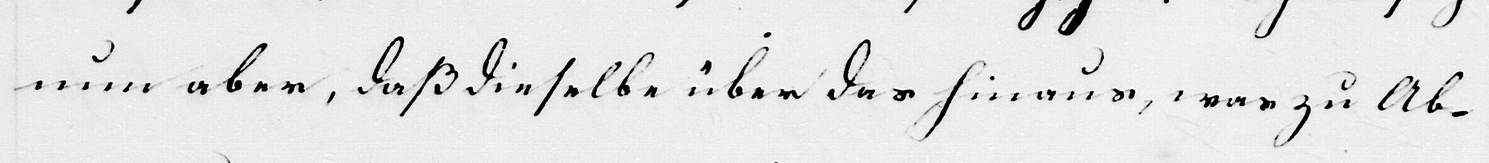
nun aber, daß dieselbe über das hinaus, was zu Ab¬
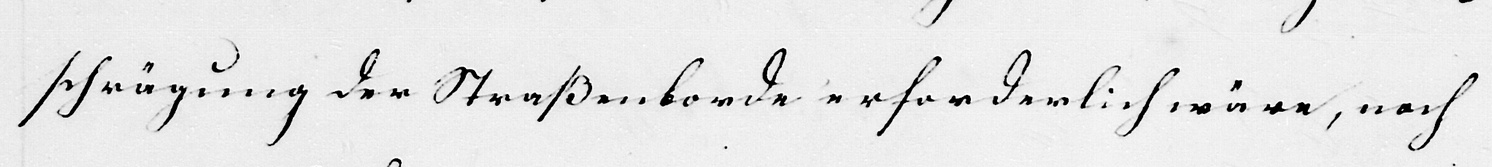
schrägung der Straßenborde erforderlich wäre, noch
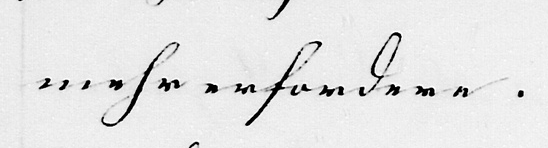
mehr erfordere.
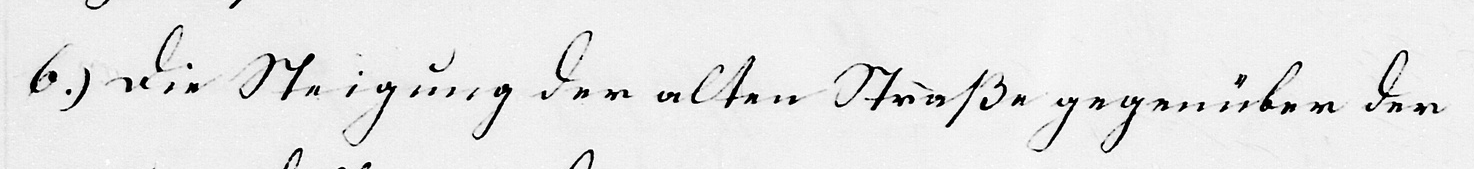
6.) Die Steigung der alten Straße gegenüber der
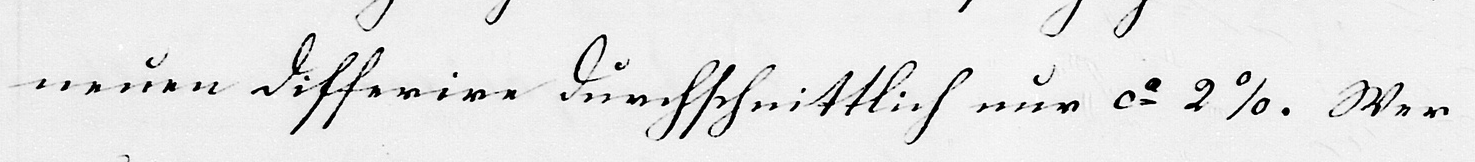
neuen differire durchschnittlich nur ca 2 %. Wer
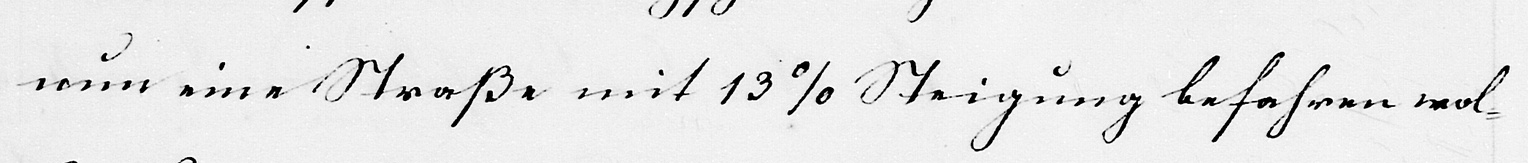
nun eine Straße mit 13 % Steigung befahren wol¬
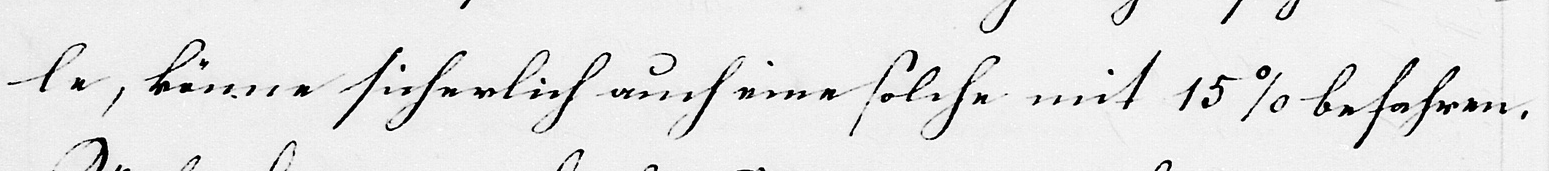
le, könne sicherlich auch eine solche mit 15 % befahren.
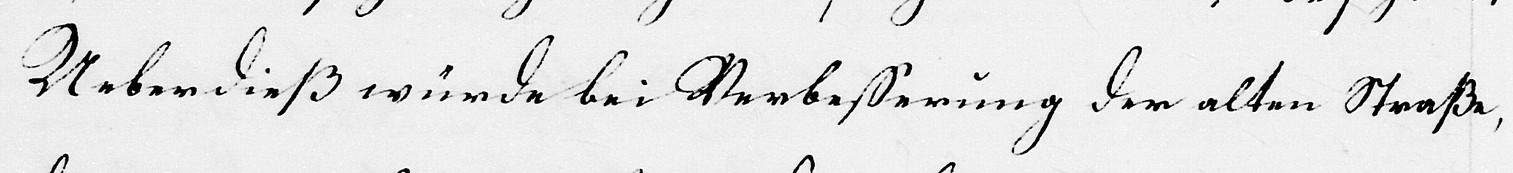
Ueberdieß würde bei Verbeßerung der alten Straße,
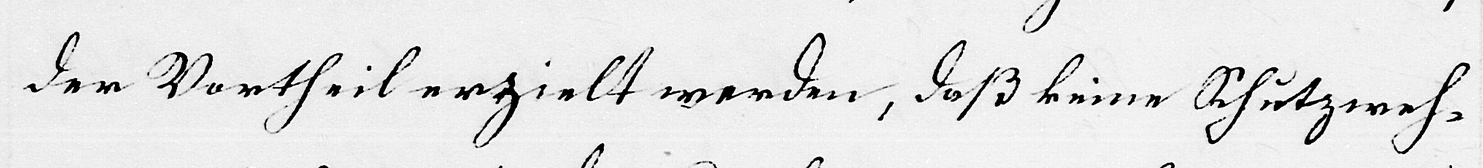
der Vortheil erzielt werden, daß keine Schutzweh¬
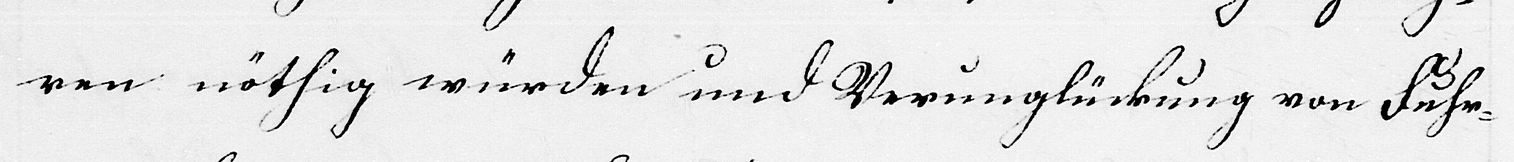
ren nöthig würden und Verunglückung von Fuhr¬
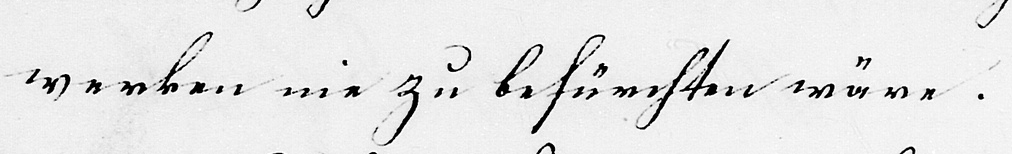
werken nie zu befürchten wäre.
